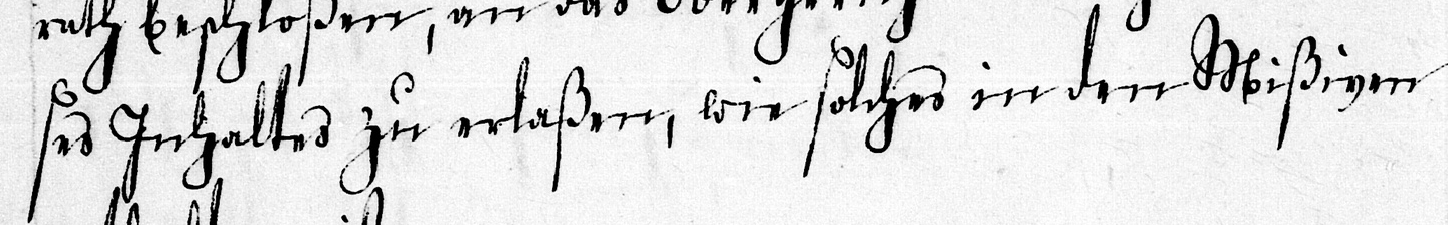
ses Inhaltes zu erlaßen, wie solches in den Mißiven
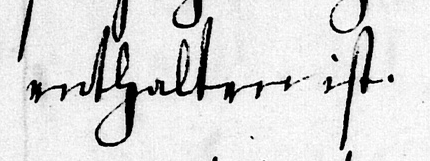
enthalten ist.
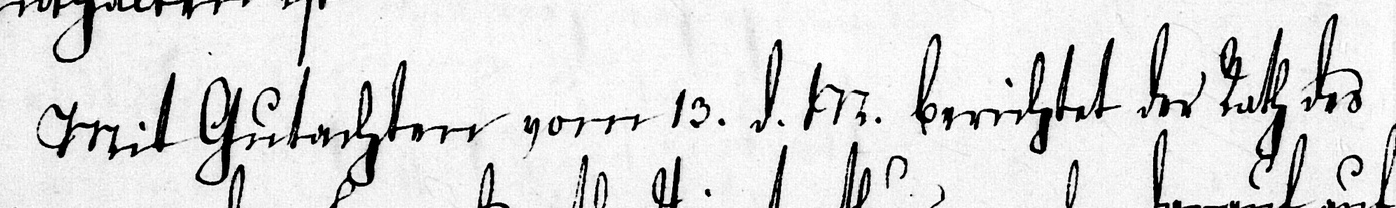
Mit Gutachten vom 13. d. M. berichtet der Rath des
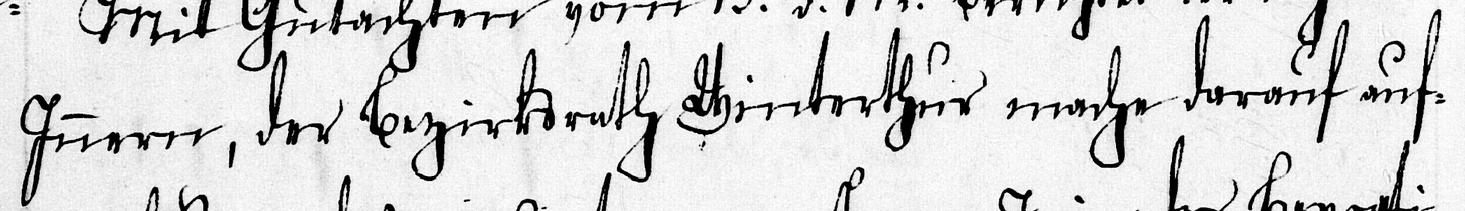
Innern, der Bezirksrath Winterthur mache darauf auf¬
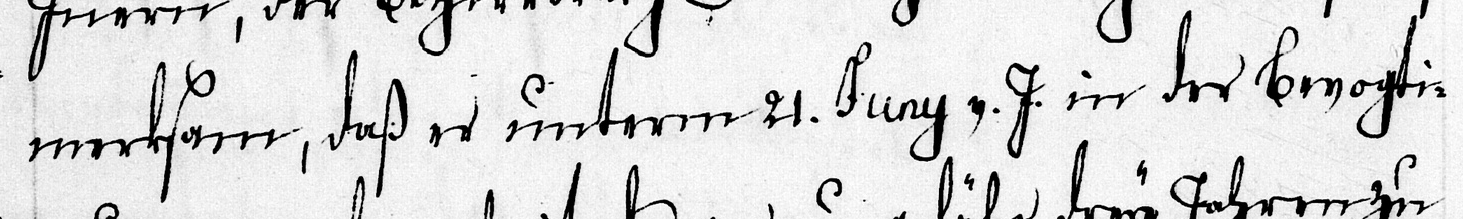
merksam, daß er unterm 21. Juny v. J. in der Bevogti¬
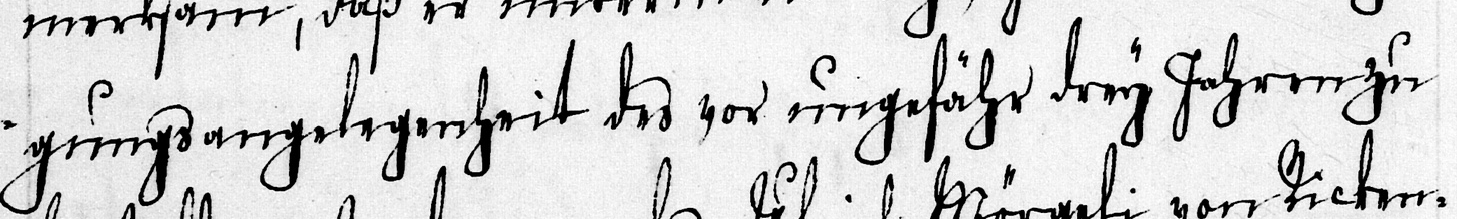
gungsangelegenheit des vor ungefähr drey Jahren zu
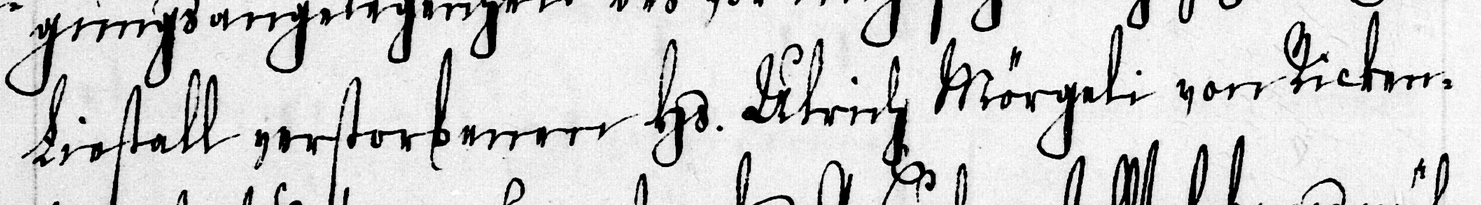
Liestall verstorbenen Hs. Ulrich Mörgeli von Rickenb¬
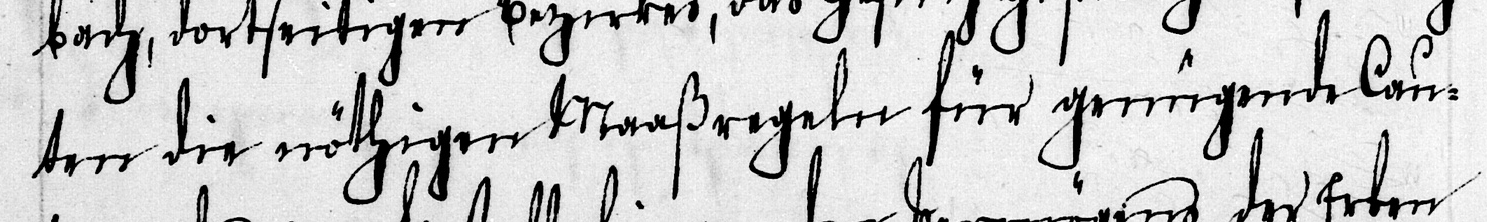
hten die nöthigen Maaßregeln für genügende Cau¬
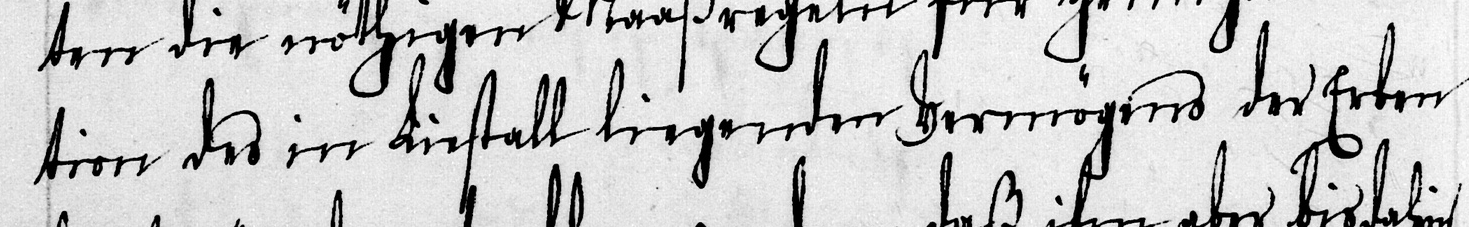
tion des in Liestall liegenden Vermögens der Erben
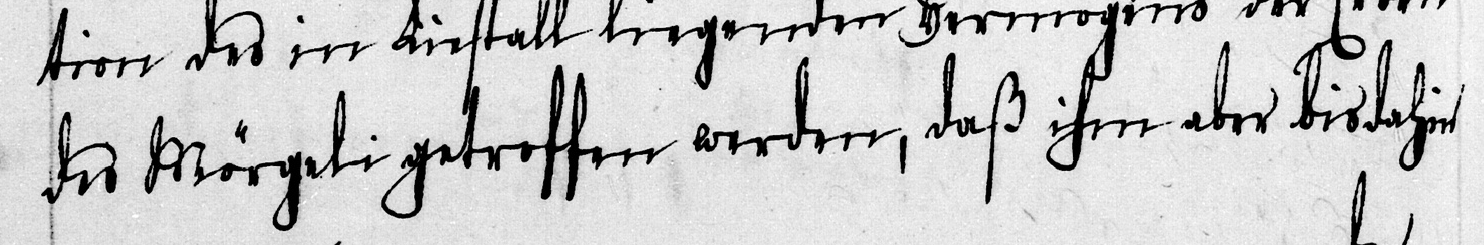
des Mörgeli getroffen werden, daß ihm aber bis dah¬
